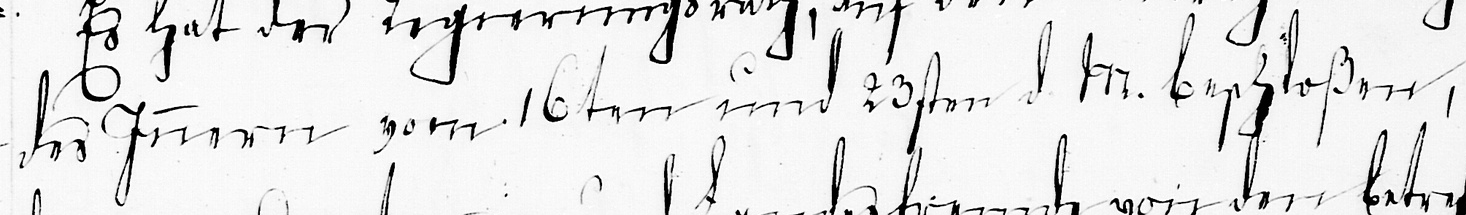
des Innern vom 16ten und 23ten d. M. beschloßen,
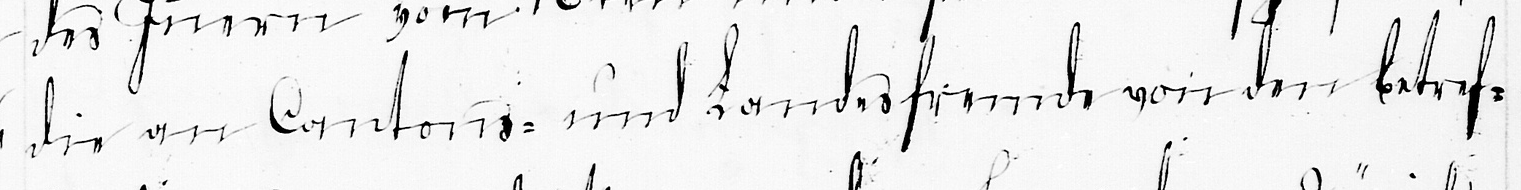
die an Cantons- und Landesfremde von den betref¬
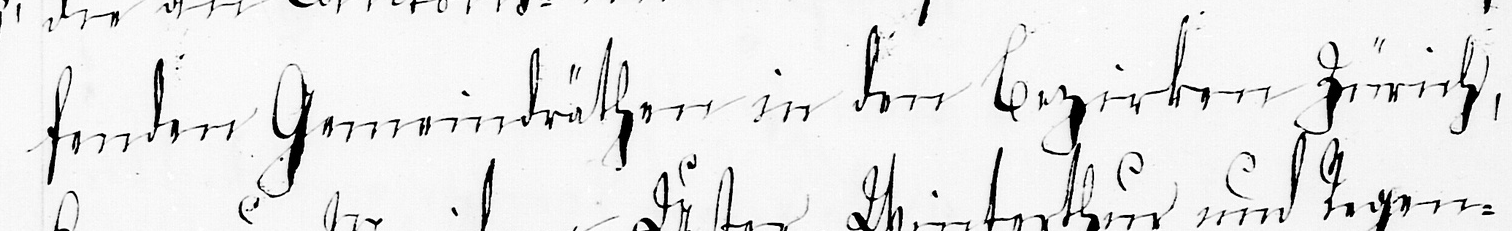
fenden Gemeindräthen in den Bezirken Zürich,
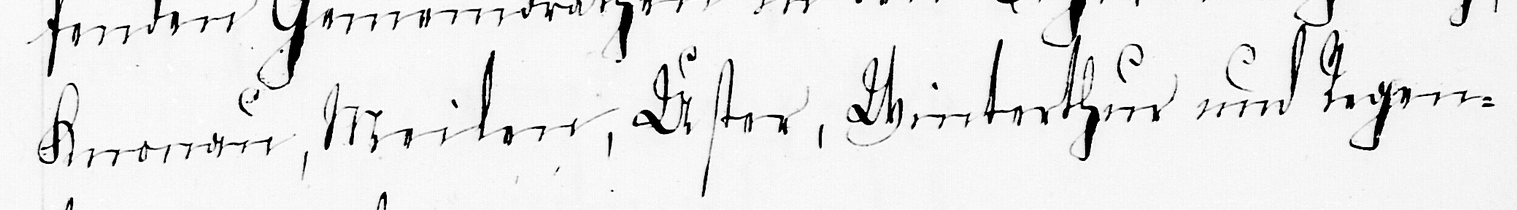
Knonau, Meilen, Uster, Winterthur und Regen¬
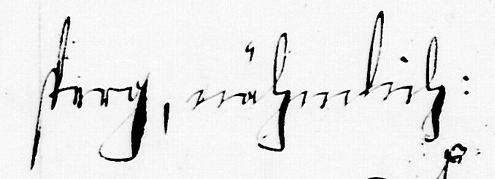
sperg, nähmlich:
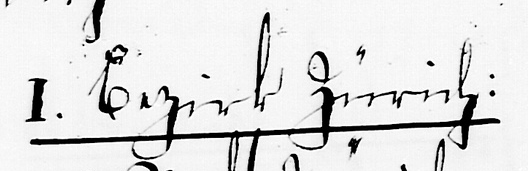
I. Bezirk Zürich:
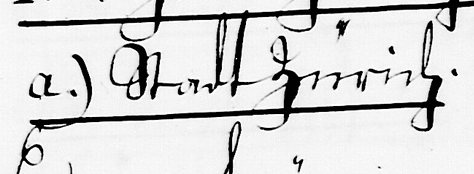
a.) Stadt Zürich.
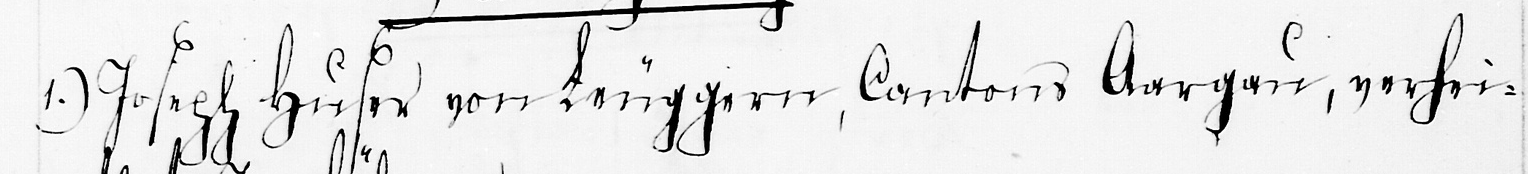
1.) Joseph Huser von Leuggern, Cantons Aargau, verhei¬
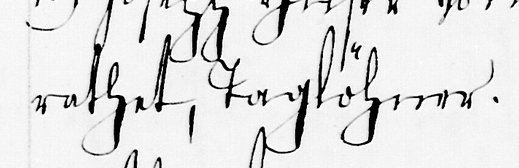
rathet, Taglöhner.
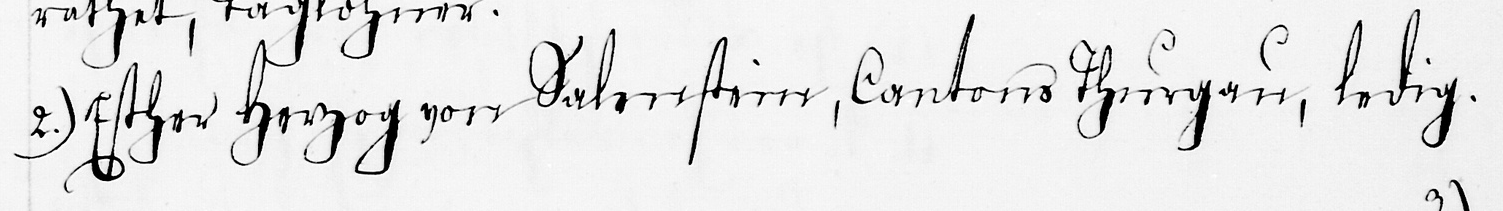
2.) Esther Herzog von Salenstein, Cantons Thurgau, ledig.
